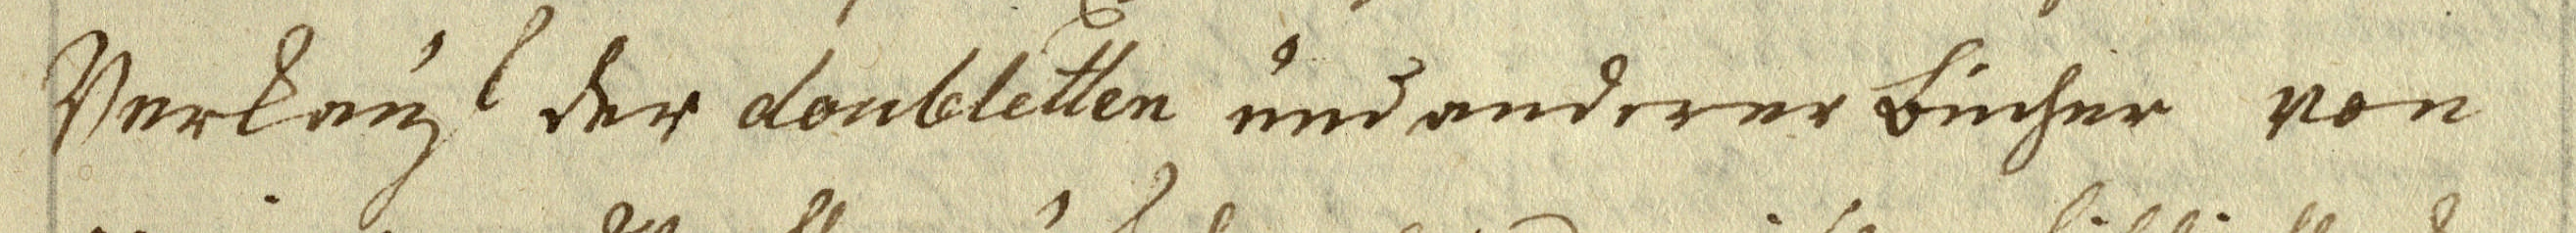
Verkauf der doubletten und anderer Bücher von
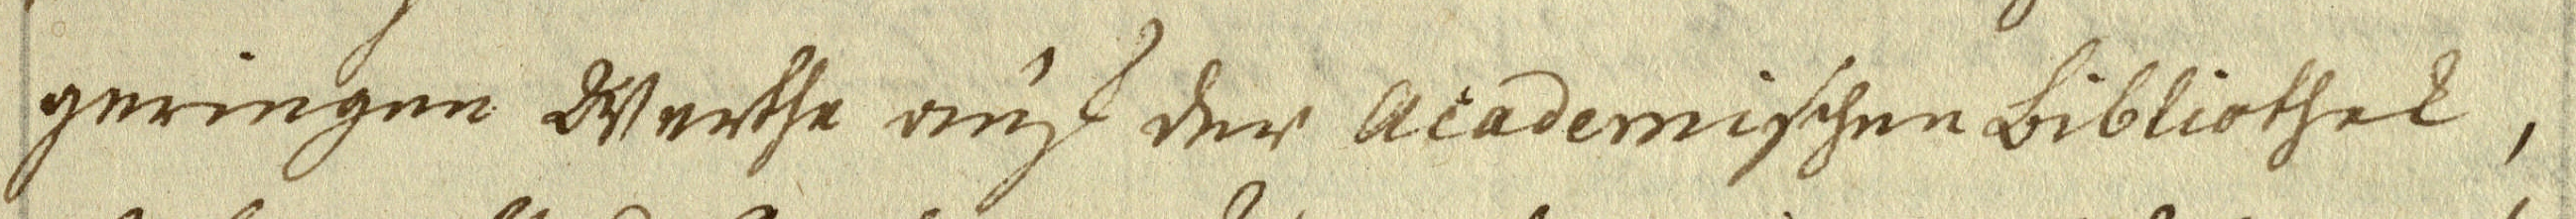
geringen Werthe auf der Academischen Bibliothek,
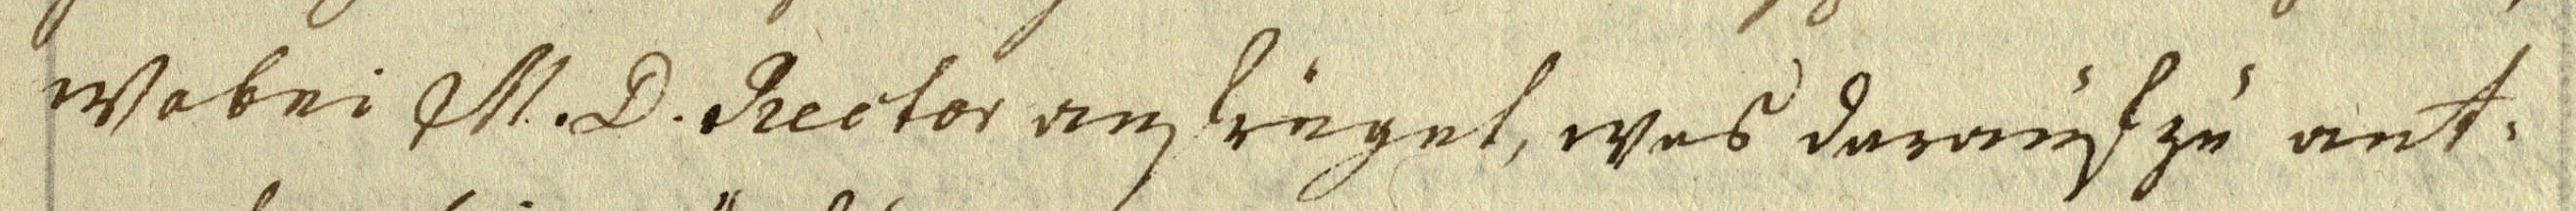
wobei M. D. Rector anfräget, was darauf zu ant¬
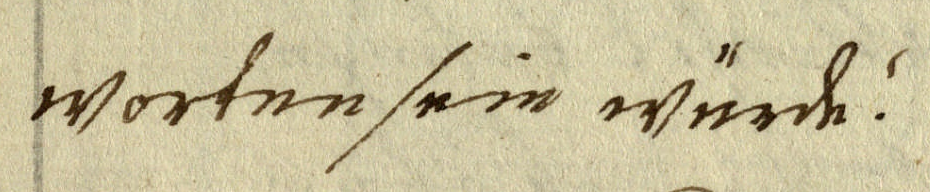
worten sein würde!
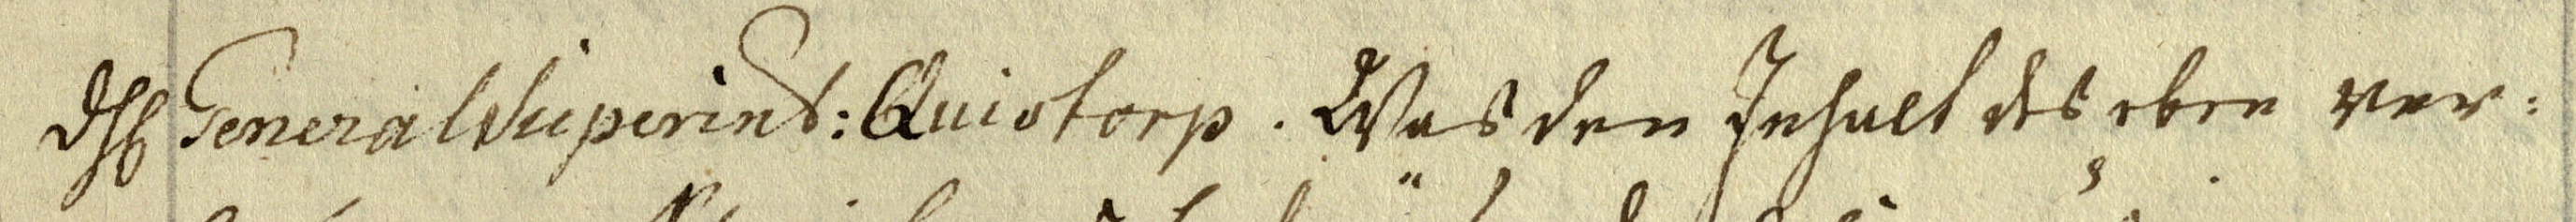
dh GeneralSuperint: Quistorp. Was den Inhalt des eben ver¬
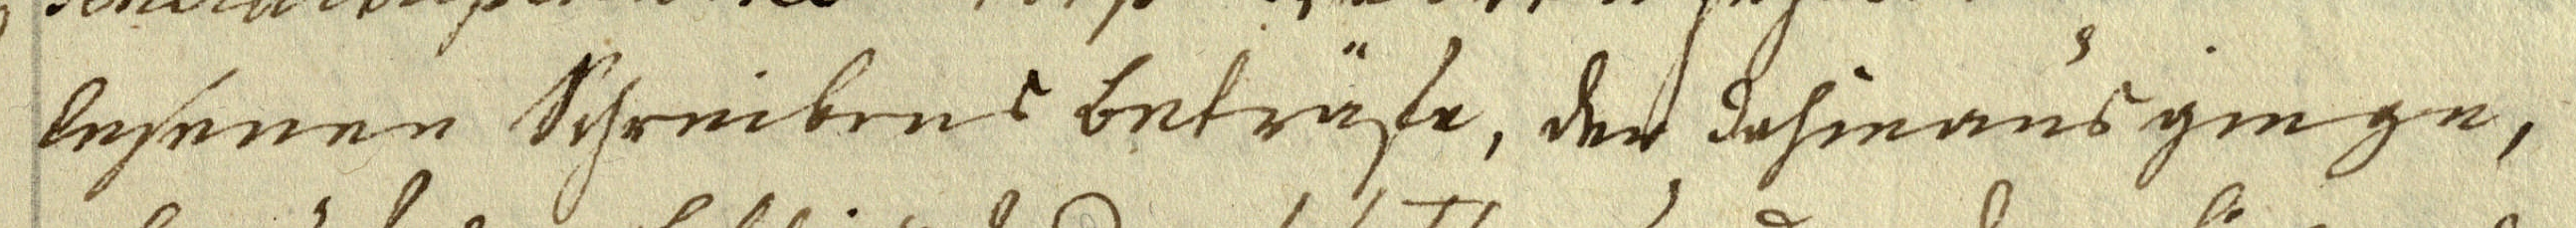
lesenen Schreibens beträfe, der dahinaus ginge,
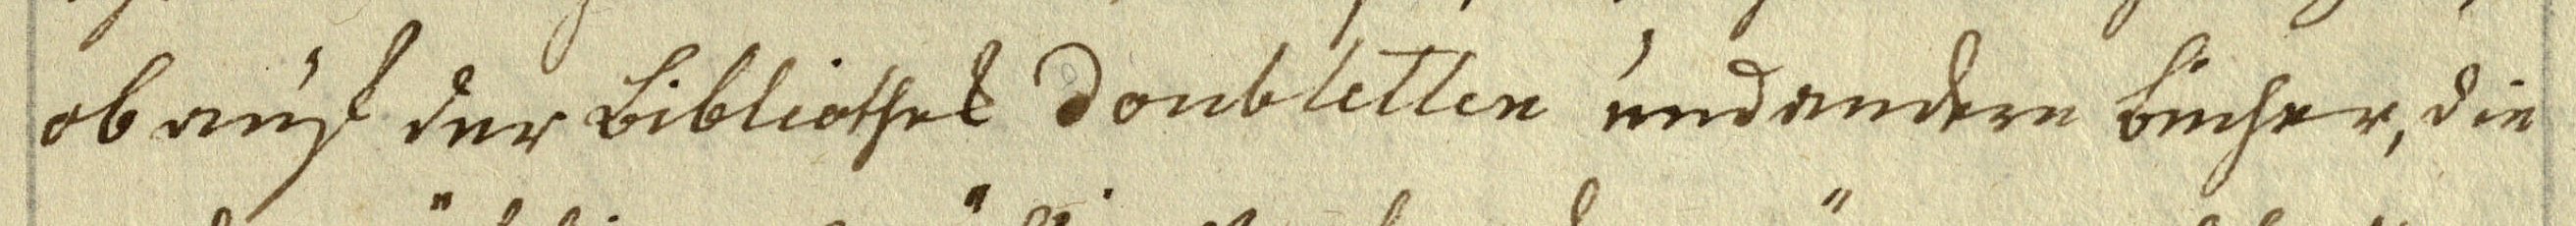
ob auf der Bibliothek doubletten und andere Bücher, die
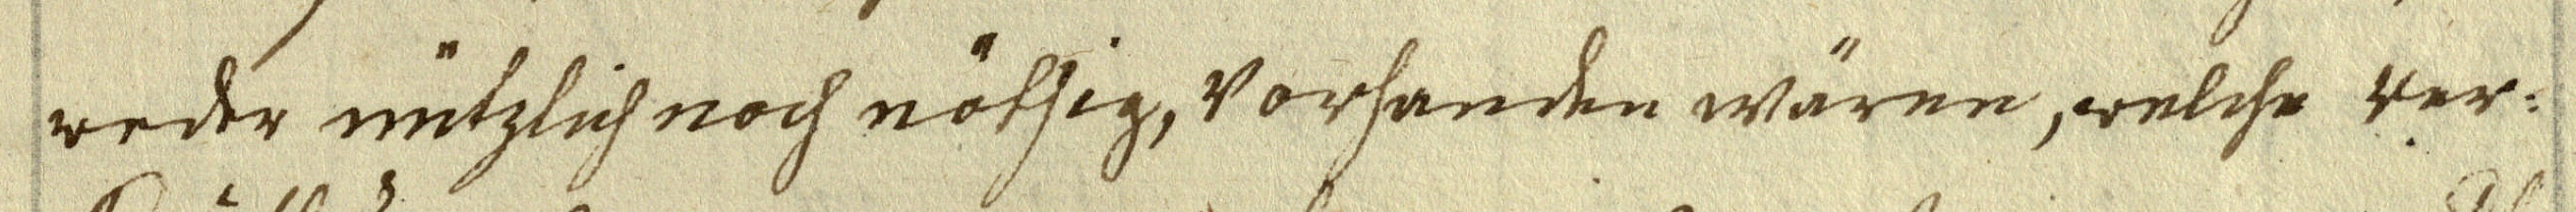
weder nützlich noch nöthig, vorhanden wären, welche ver¬
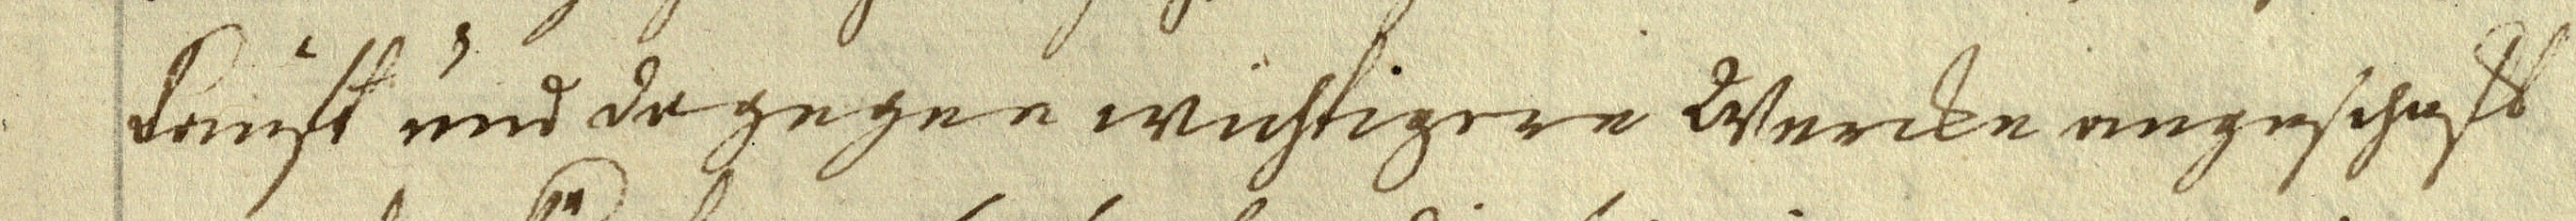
kauft und dagegen wichtigere Wercke angeschaft
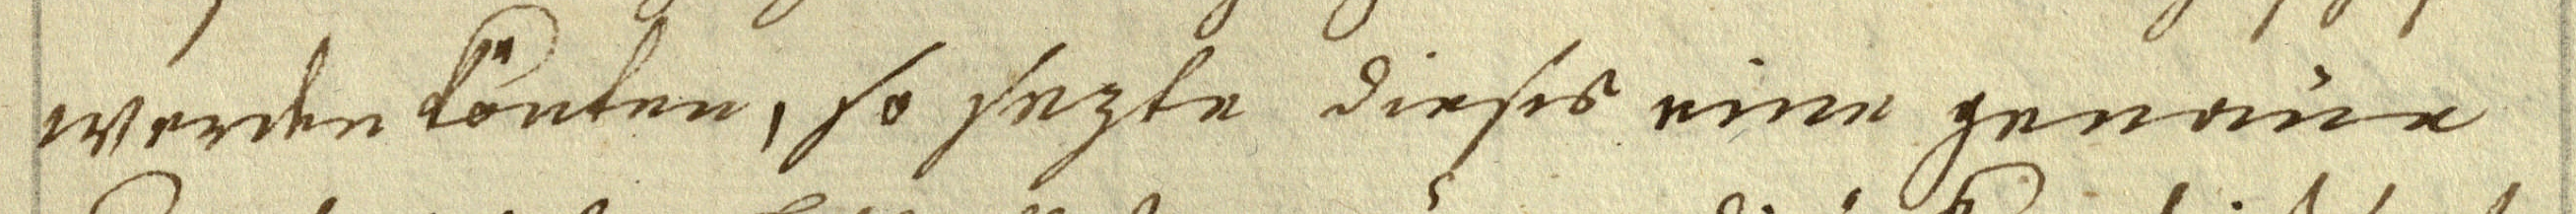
werden könten, so sezte dieses eine genaue
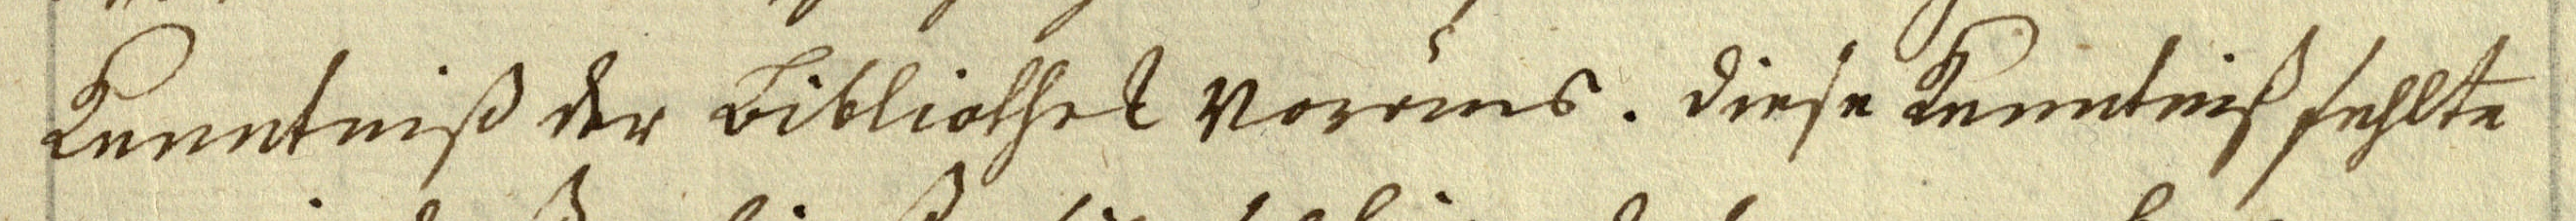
Kenntniß der Bibliothek voraus. Diese Kenntniß fehlte
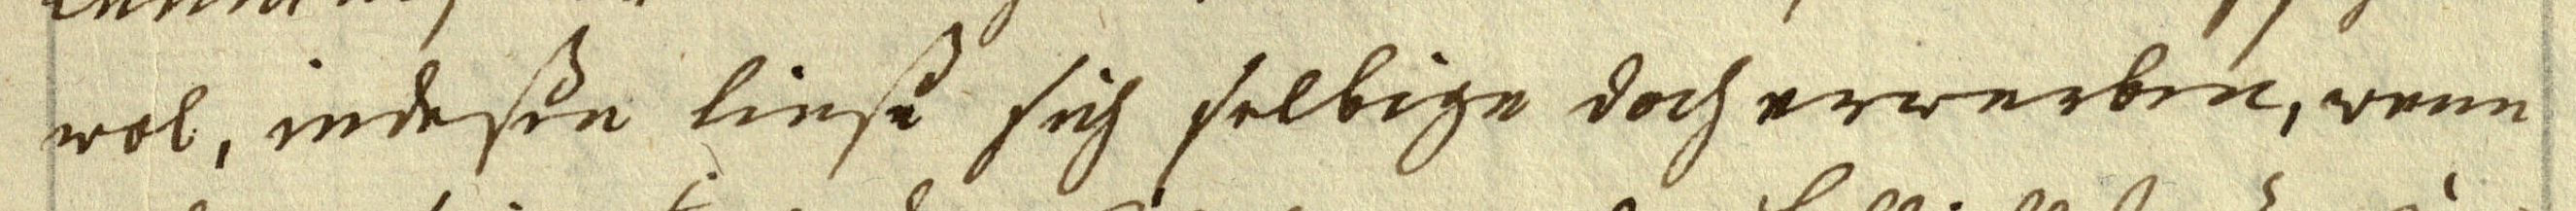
wol, indeßen ließe sich selbige doch erwerben, wenn
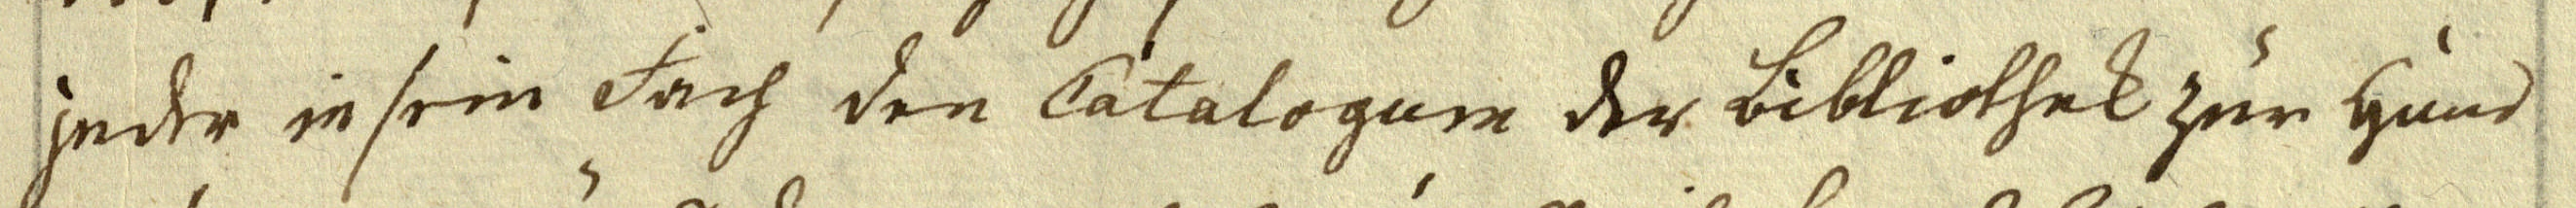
jeder in sein fach den Catalogum der Bibliothek zur Hand
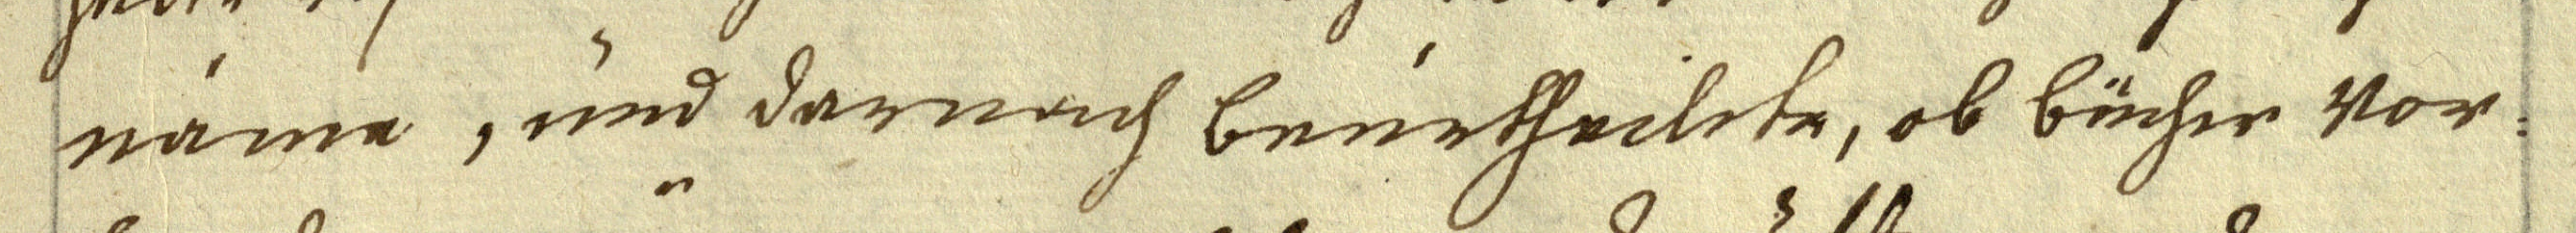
näme, und darnach beurtheilete, ob Bücher vor¬
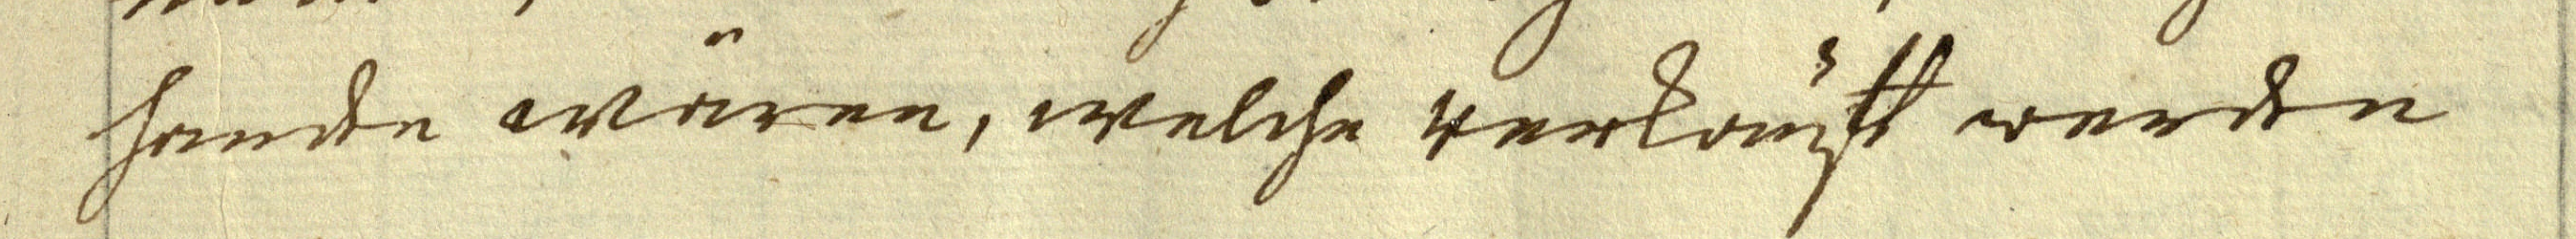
handen wären, welche verkauft werden
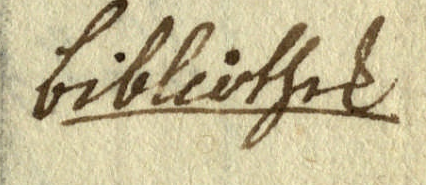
Bibliothek
